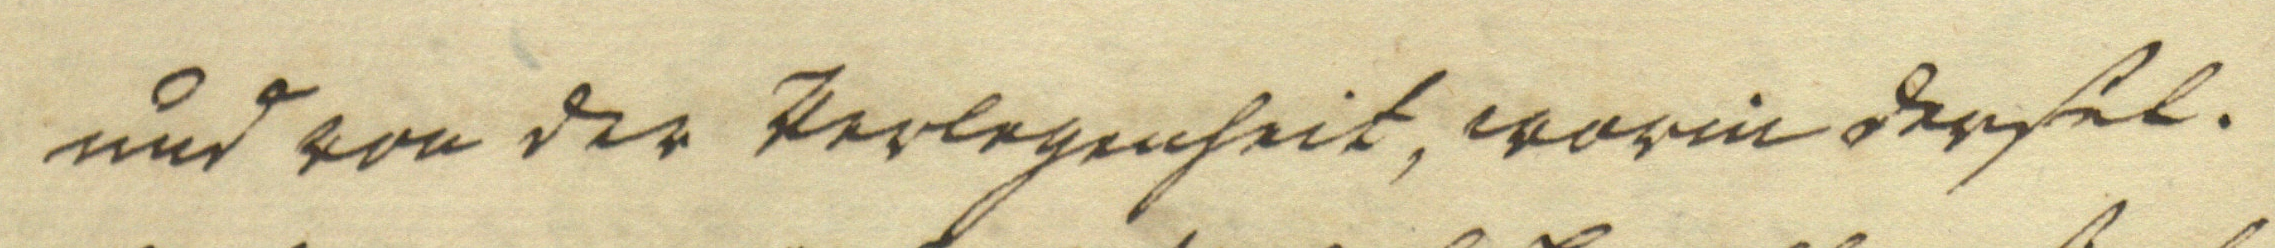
und von der Verlegenheit, worin dersel¬
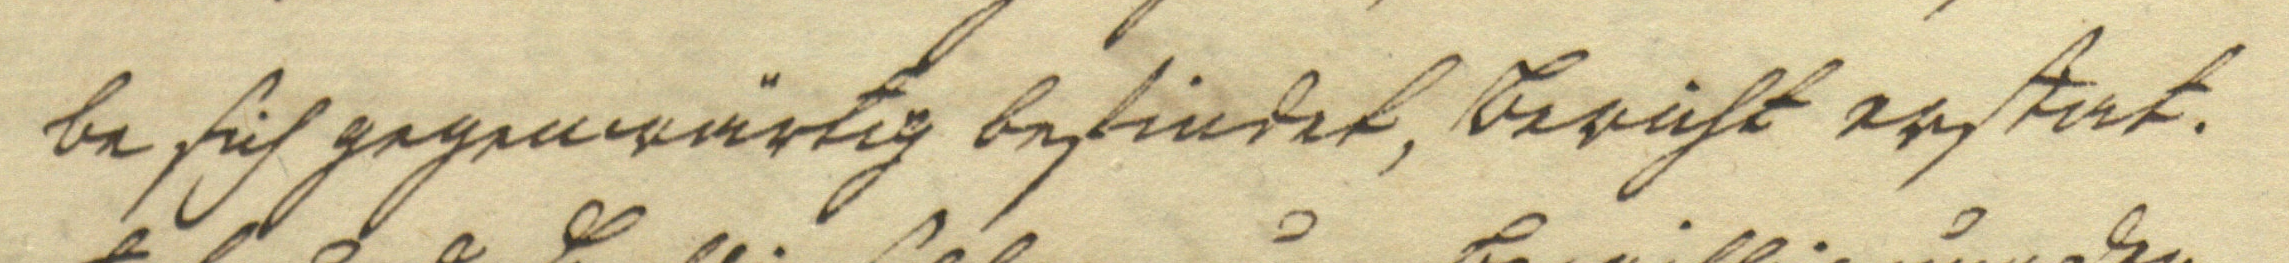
be sich gegenwärtig befindet, Bericht erstat¬
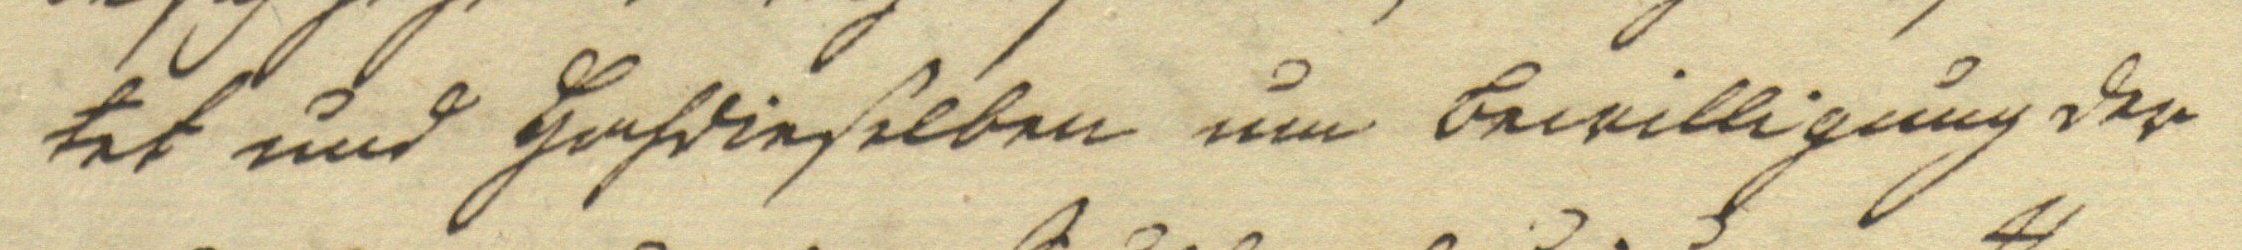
tet und Hochdieselben um Bewilligung der
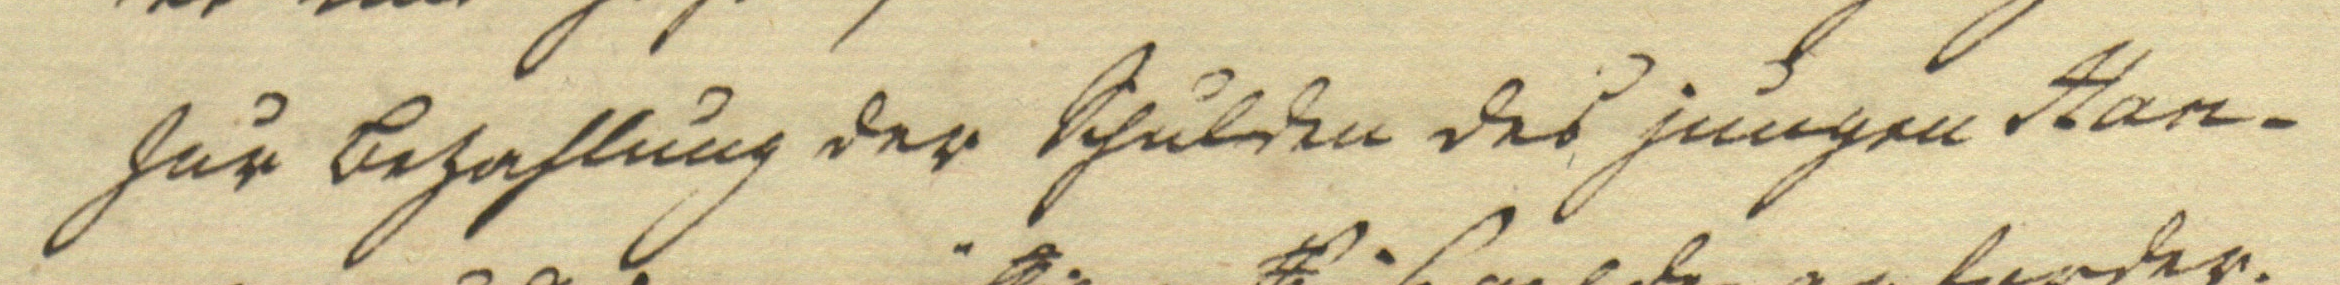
zur Bezahlung der Schulden des jungen Han¬
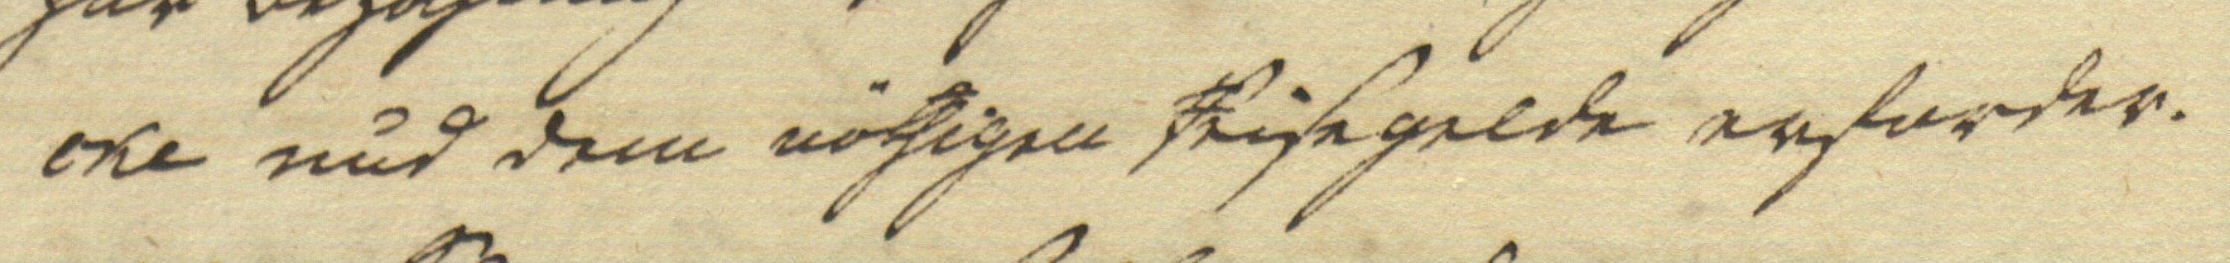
cke und dem nöthigen Reisegelde erforder¬
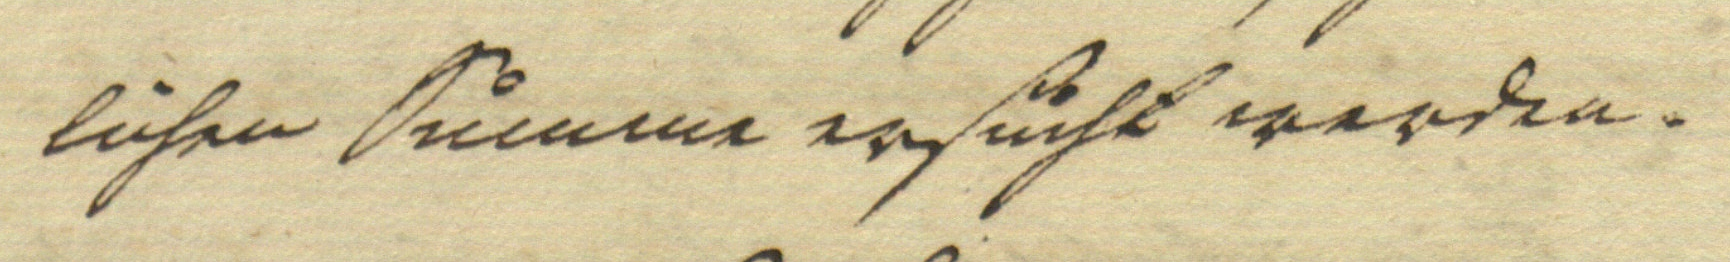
lichen Summe ersucht werden.
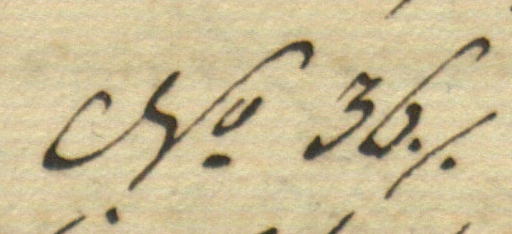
No 36.
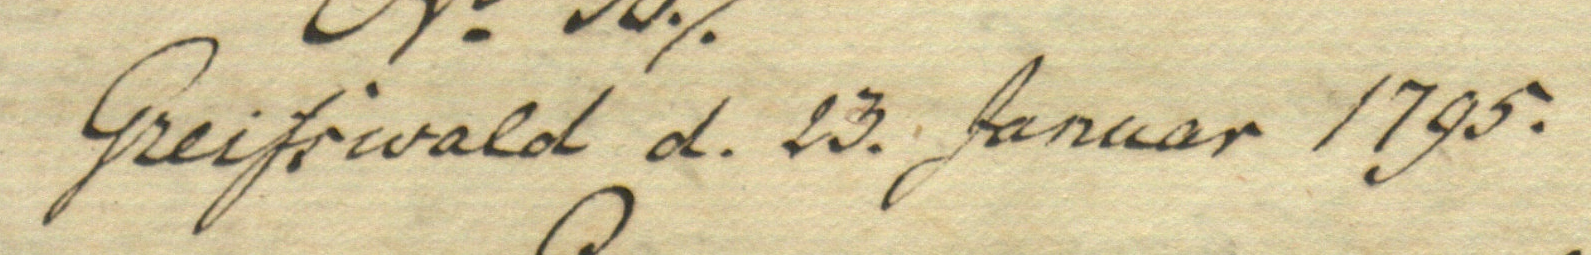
Greifswald d. 23. Januar 1795.
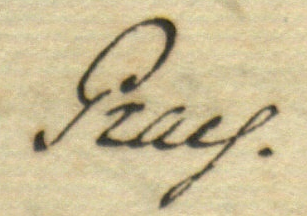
Praes.
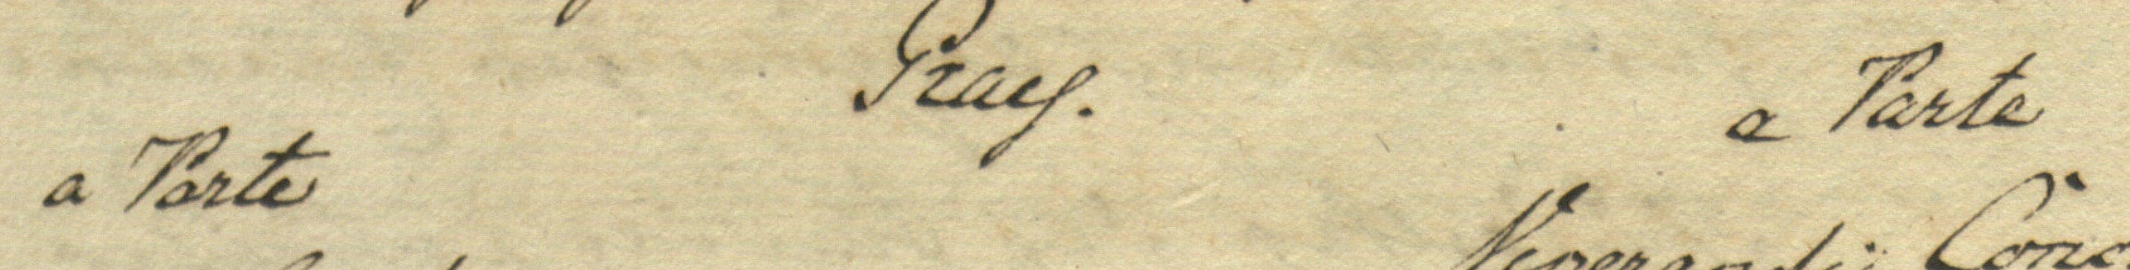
a Parte a Parte
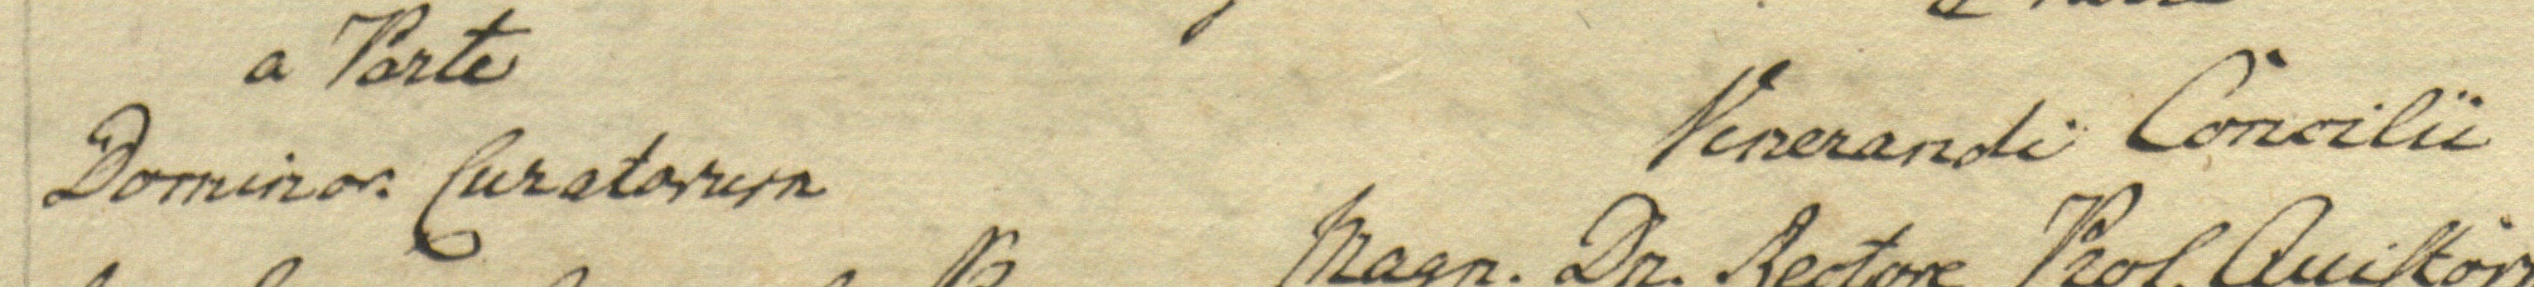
Domino. Curatorum Venerandi Concilii
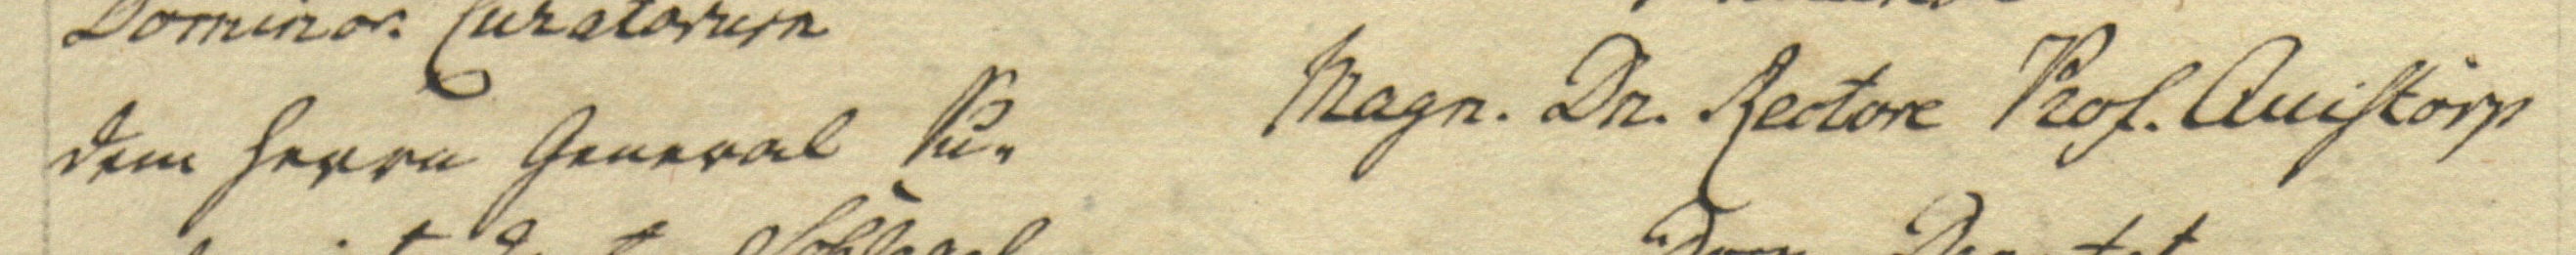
dem Herrn General Su¬ Magn. Dn. Rectore Prof. Quistorp
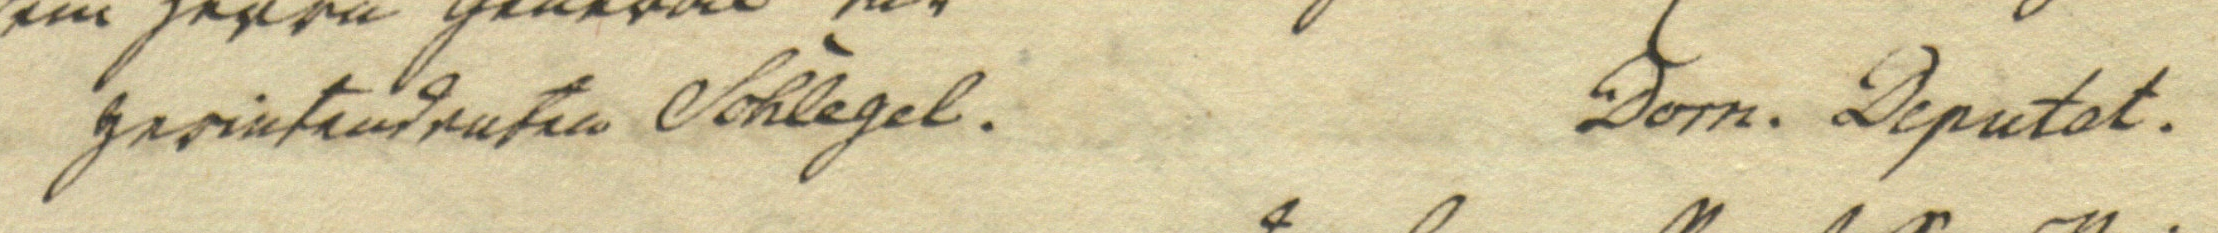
perintendenten Schlegel. Dom. Deputat.
